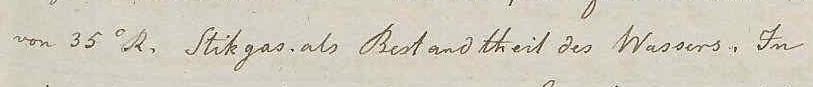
von 35° R. Stikgas als Bestandtheil des Wassers. In
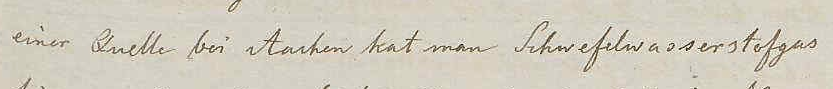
einer Quelle bei Aachen hat man Schwefelwasserstofgas
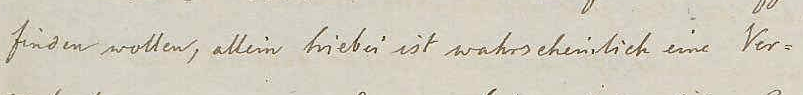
finden wollen, allein hiebei ist wahrscheinlich eine Ver-
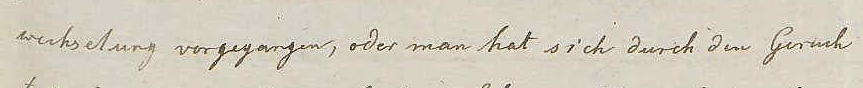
wechselung vorgegangen, oder man hat sich durch den Geruch
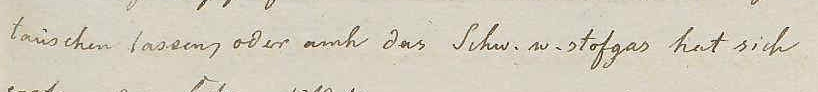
täuschen lassen, oder auch das Schw.w.stofgas hat sich
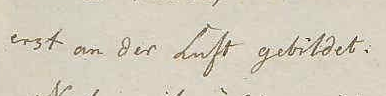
erst an der Luft gebildet.
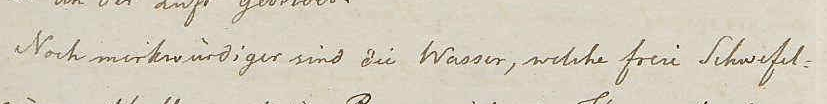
Noch merkwürdiger sind die Wasser, welche freie Schwefel-
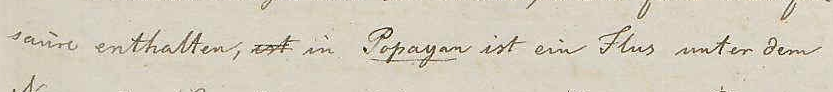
säure enthalten, ist in Popayan ist ein Flus unter dem
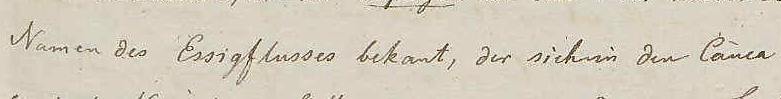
Namen des Essigflusses bekant, der sich in den Cauca
